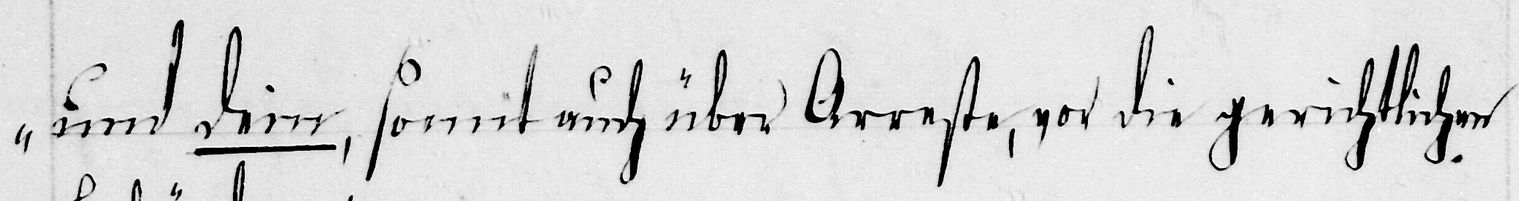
und dein, somit auch über Arreste, vor die gerichtlich¬
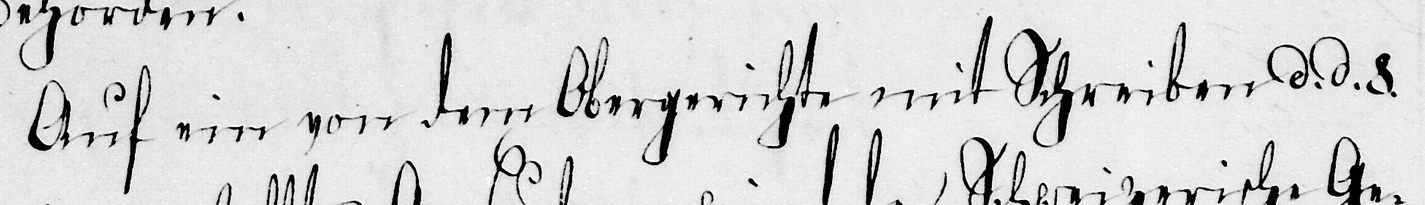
Auf ein von dem Obergerichte mit Schreiben d. d. 8.
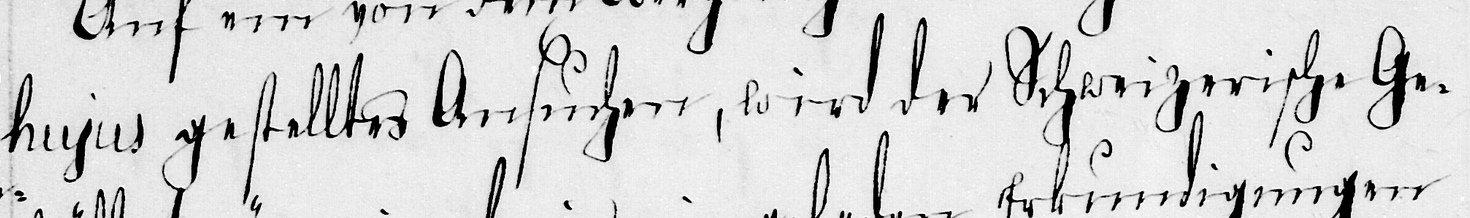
hujus gestelltes Ansuchen, wird der Schweizerische Ges¬
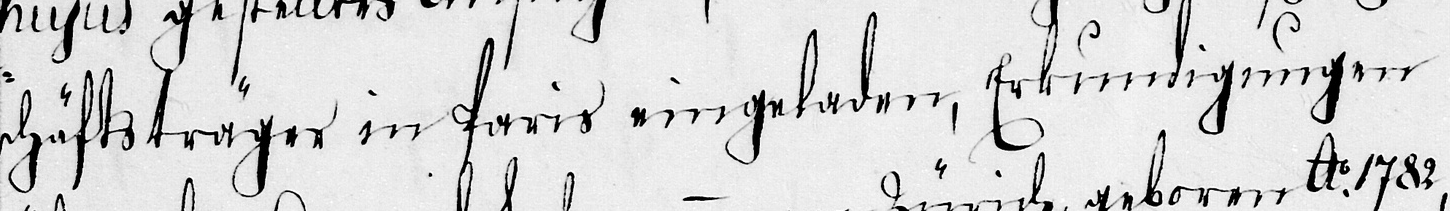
chäftsträger in Paris eingeladen, Erkundigungen
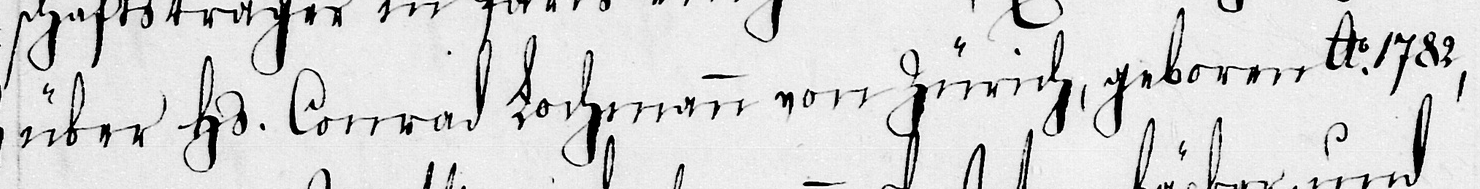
über Hs. Conrad Lochmann von Zürich, geboren Ao. 1782,
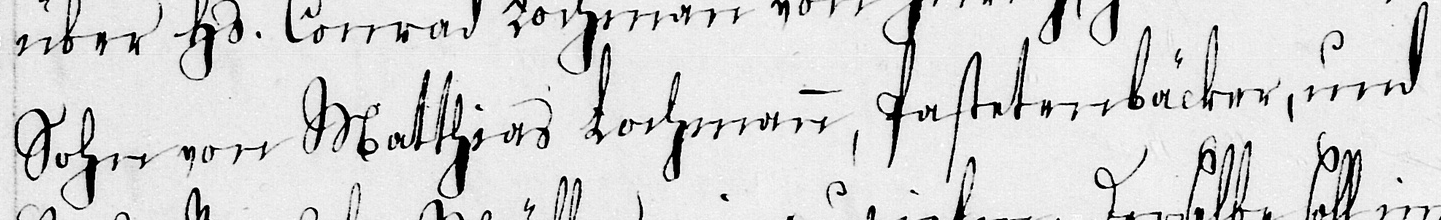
Sohn von Matthias Lochmann, Pastetenbäcker, und
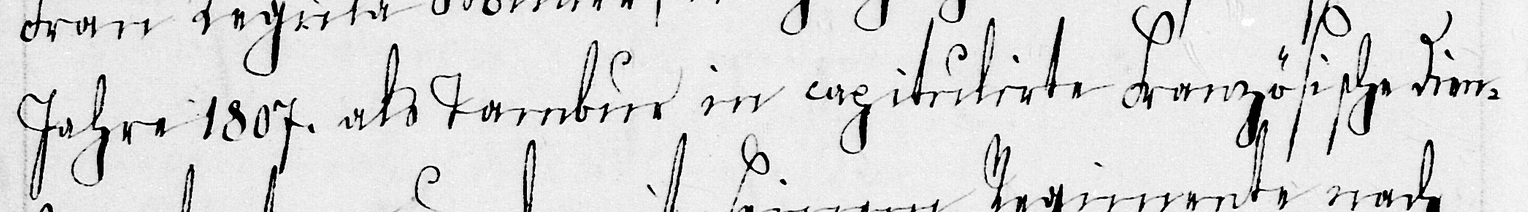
Jahre 1807. als Tambur in capitulirte Französische Dien¬
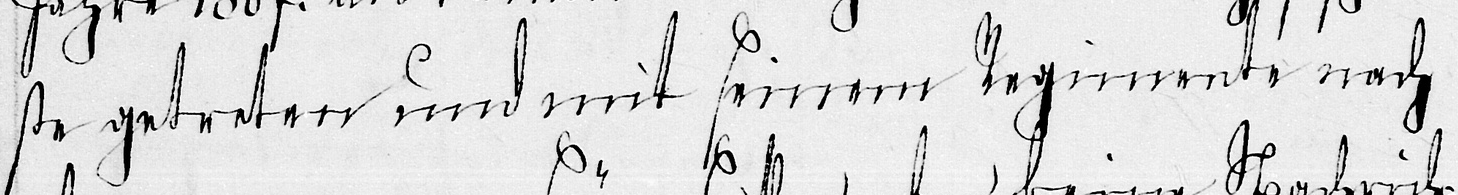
ste getreten und mit seinem Regimente nach
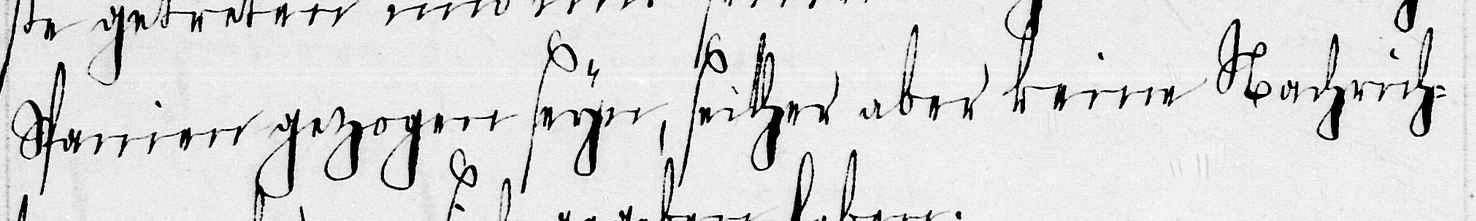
Spanien gezogen seyn, seither aber keine Nachrich¬
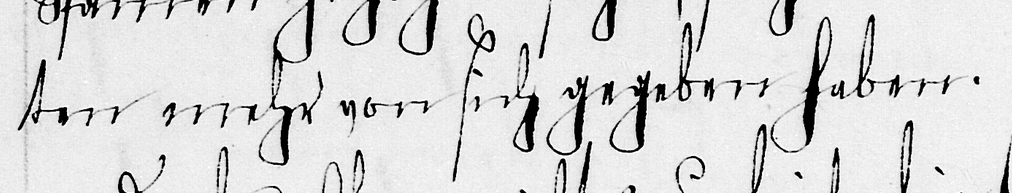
ten mehr von sich gegeben haben.
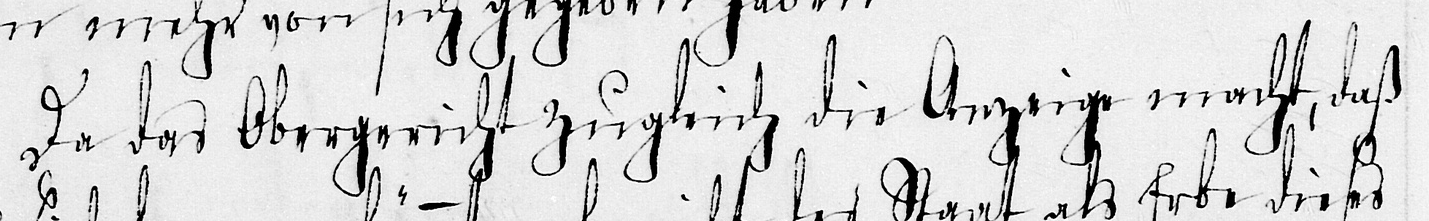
Da das Obergericht zugleich die Anzeige macht, daß
